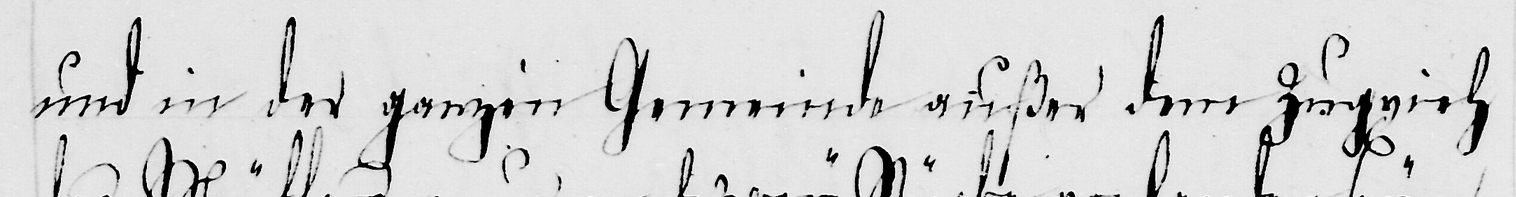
und in der ganzen Gemeinde außer dem Zugvieh
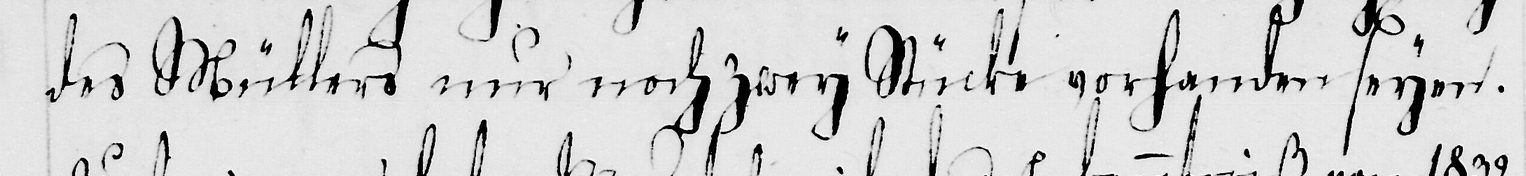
des Müllers nur noch zwey Stücke vorhanden seyen.
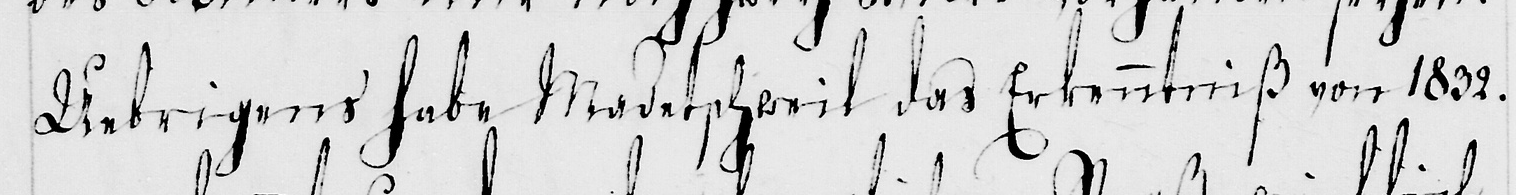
Uebrigens habe Madetschweil das Erkenntniß von 1832.
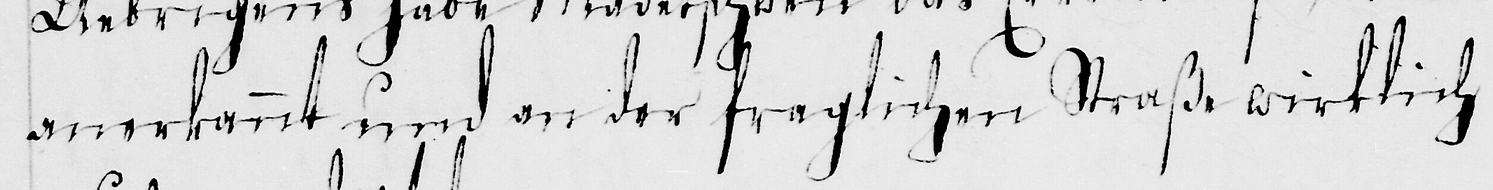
anerkannt und an der fraglichen Straße wirklich
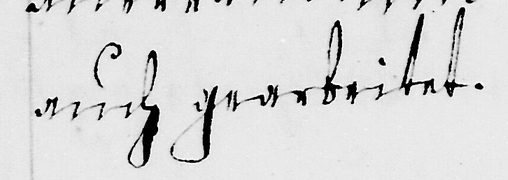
auch gearbeitet.
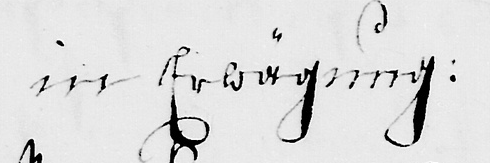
in Erwägung:
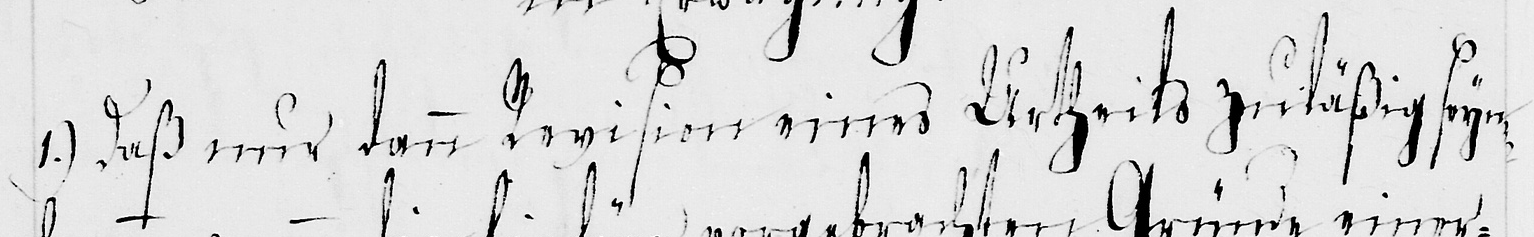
1.) Daß nur dann Revision eines Urtheils zuläßig seyn
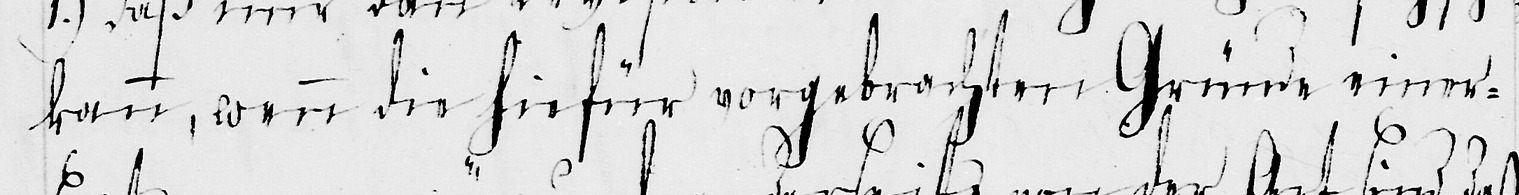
kann, wenn die hiefür vorgebrachten Gründe einer¬
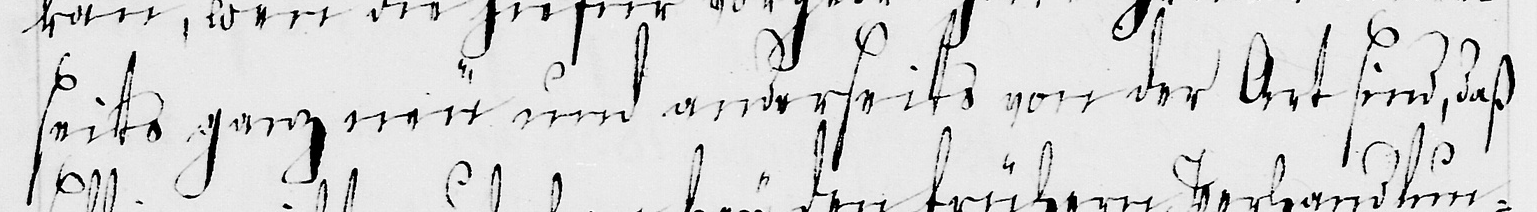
seits ganz neu und anderseits von der Art sind, daß
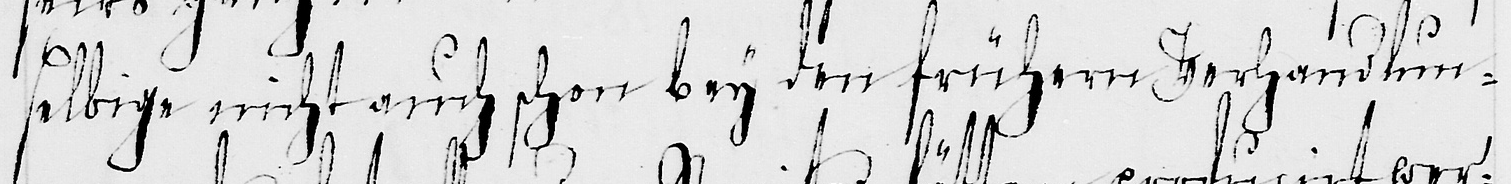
selbige nicht auch schon bey den frühern Verhandlun¬
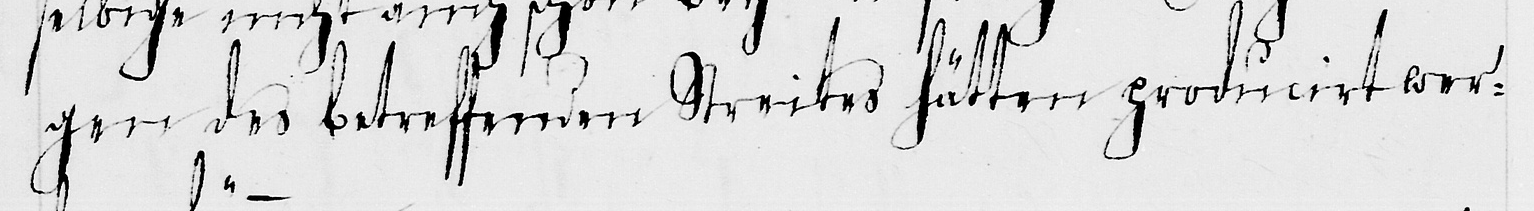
gen des betreffenden Streits hätten producirt wer¬
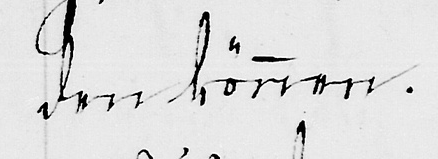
den können.
